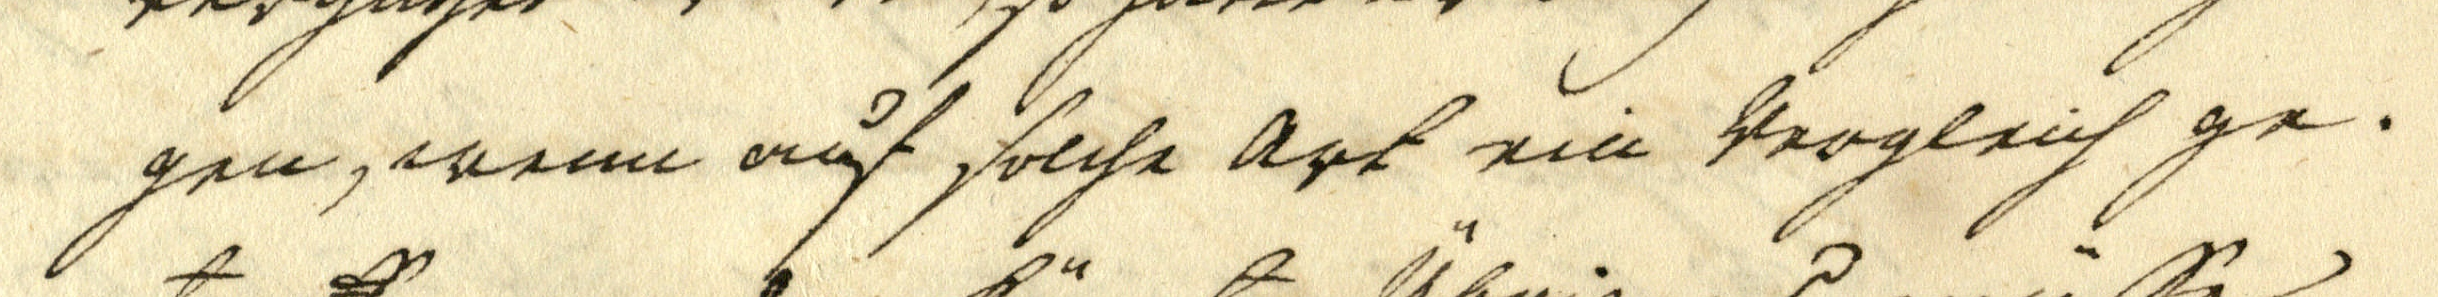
gen, wenn auf solche Art ein Vergleich ge¬
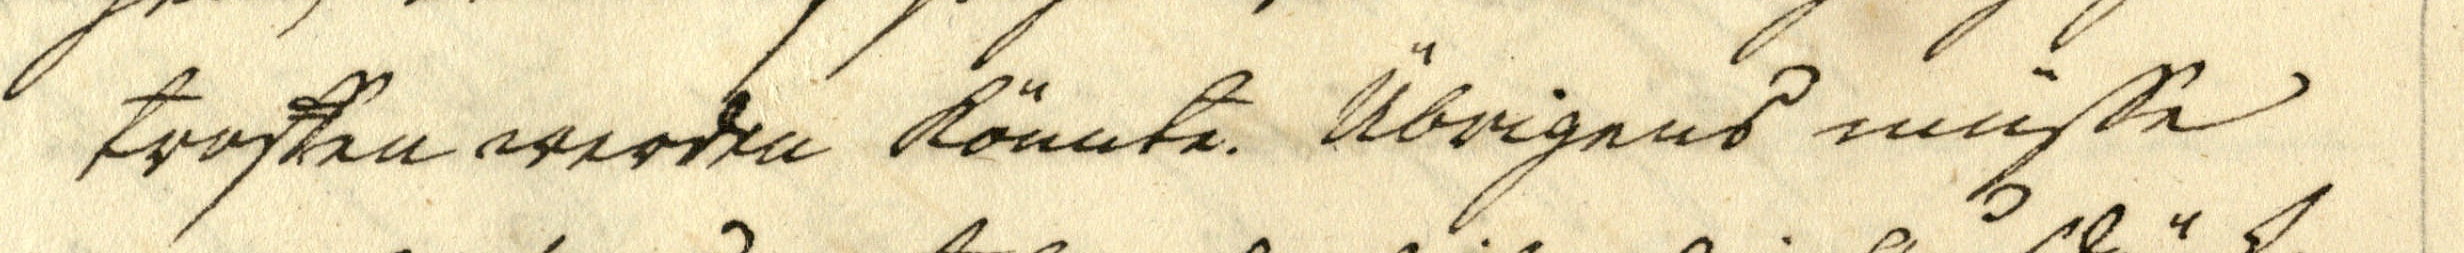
troffen werden könnte. Übrigens müsse
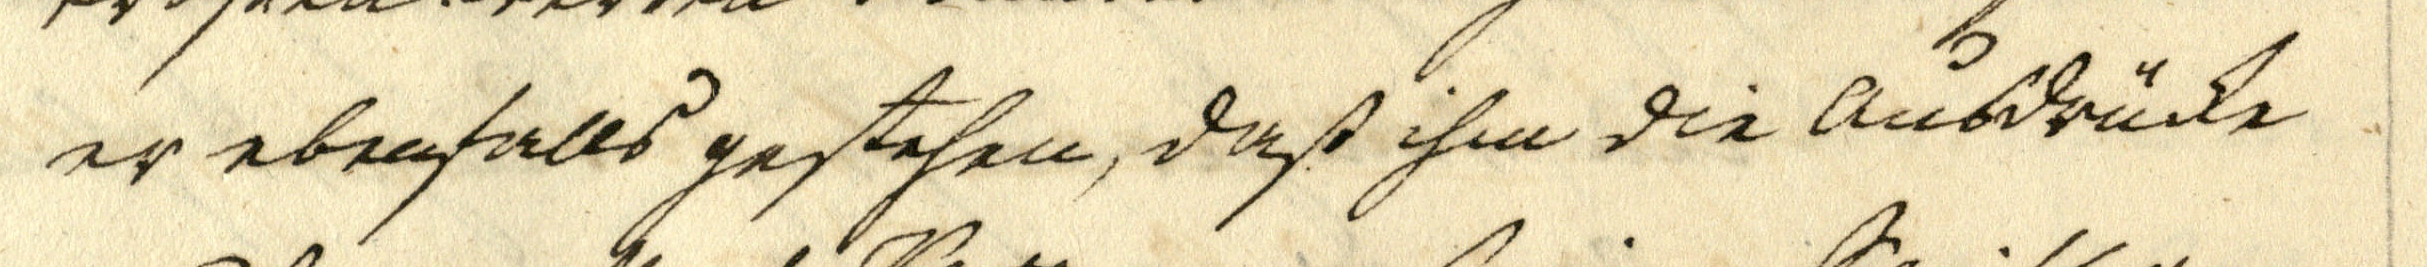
er ebenfalls gestehen, daß ihm die Ausdrücke
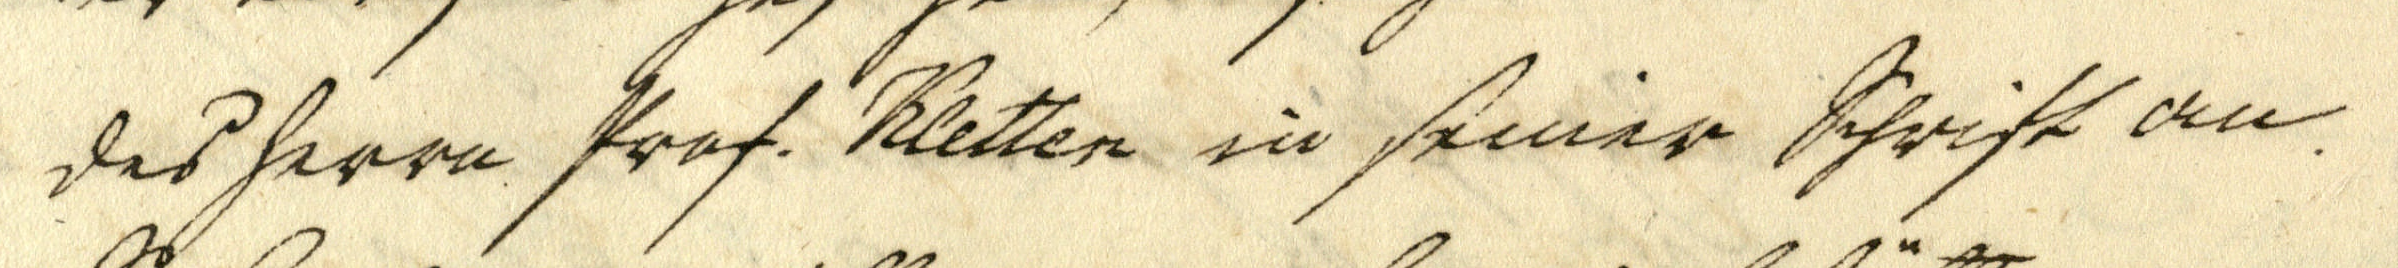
des Herrn Prof. Kletten in seiner Schrift an
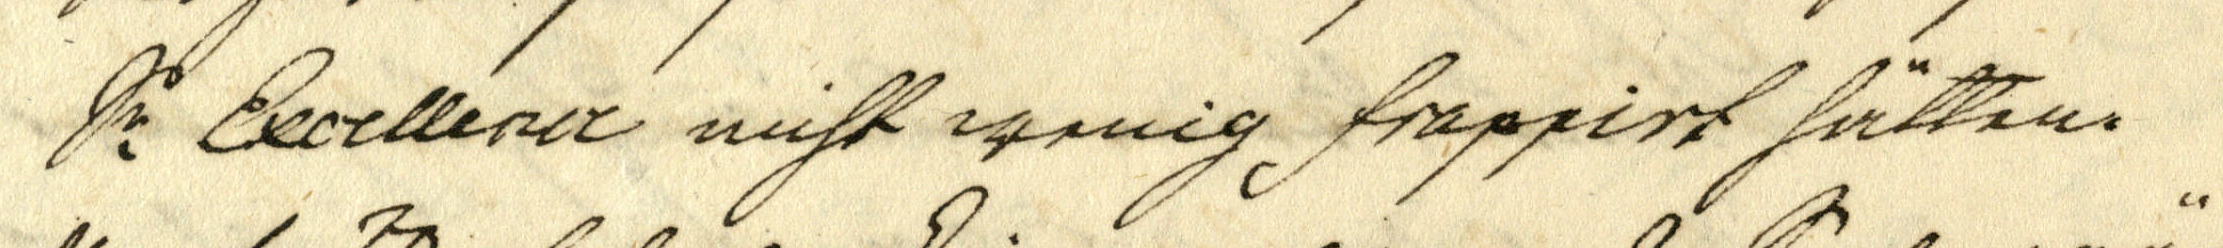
Sr Excellence nicht wenig frappirt hätten.
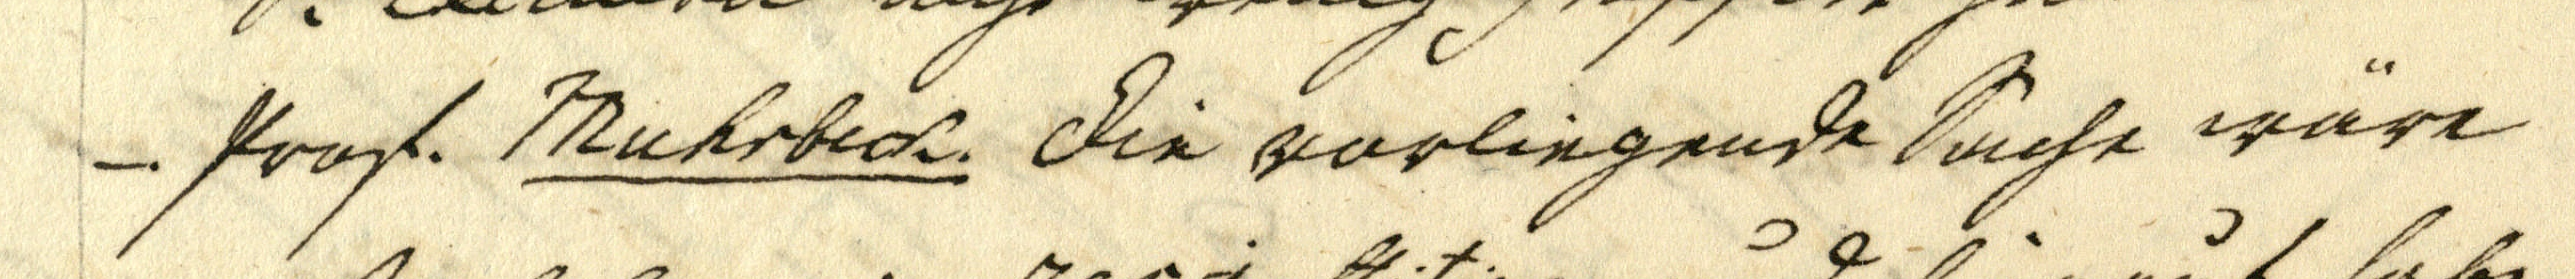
Prof. Muhrbeck. Die vorliegende Sache wäre
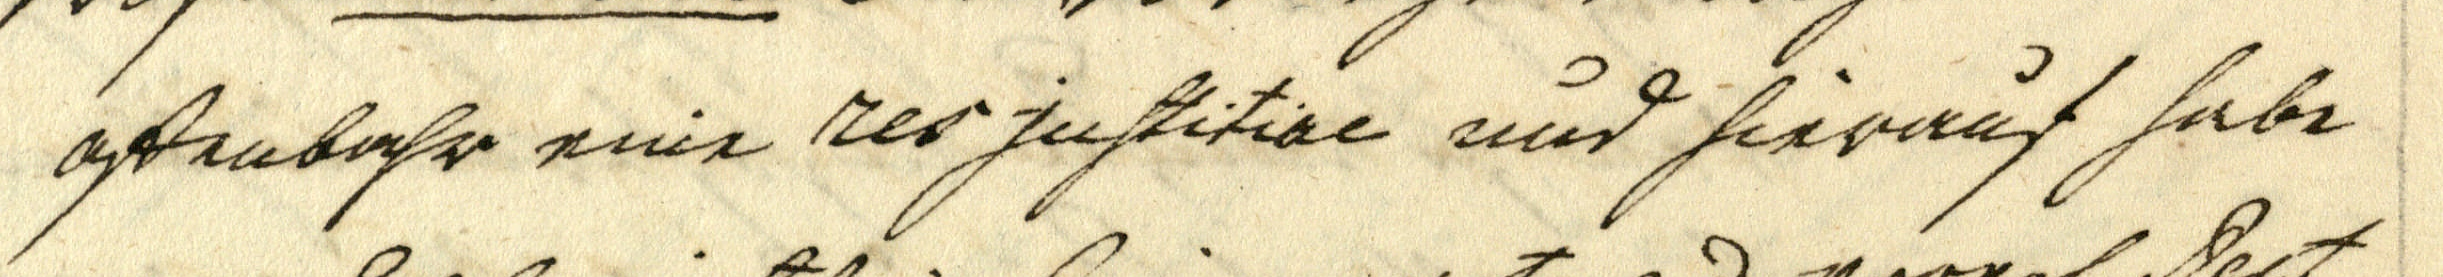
offenbahr eine res justitiae und hierauf habe
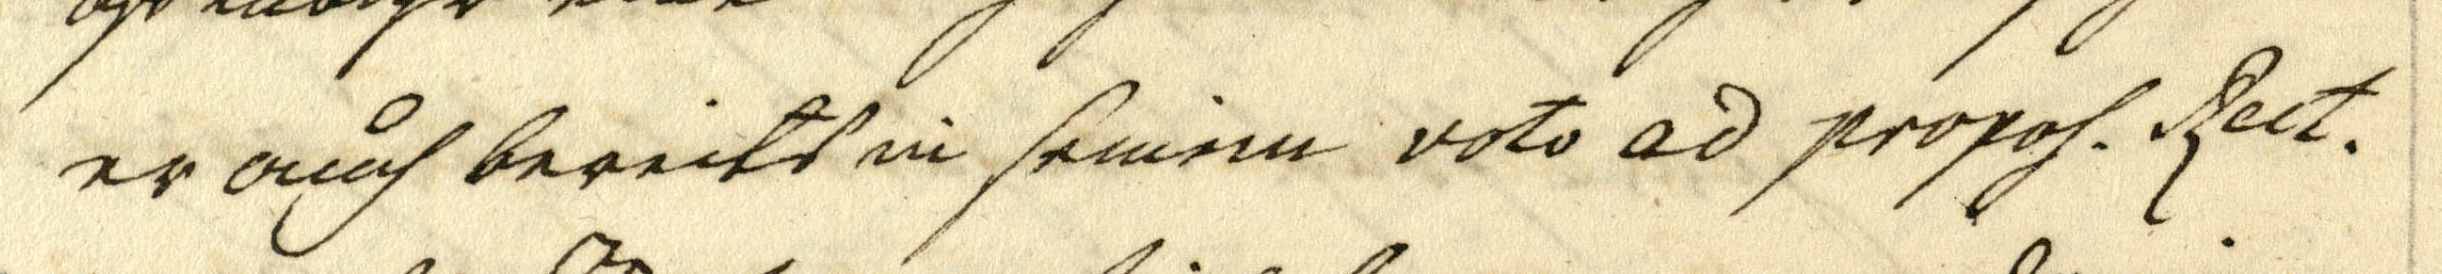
er auch bereits in seinem voto ad propos. Rect.
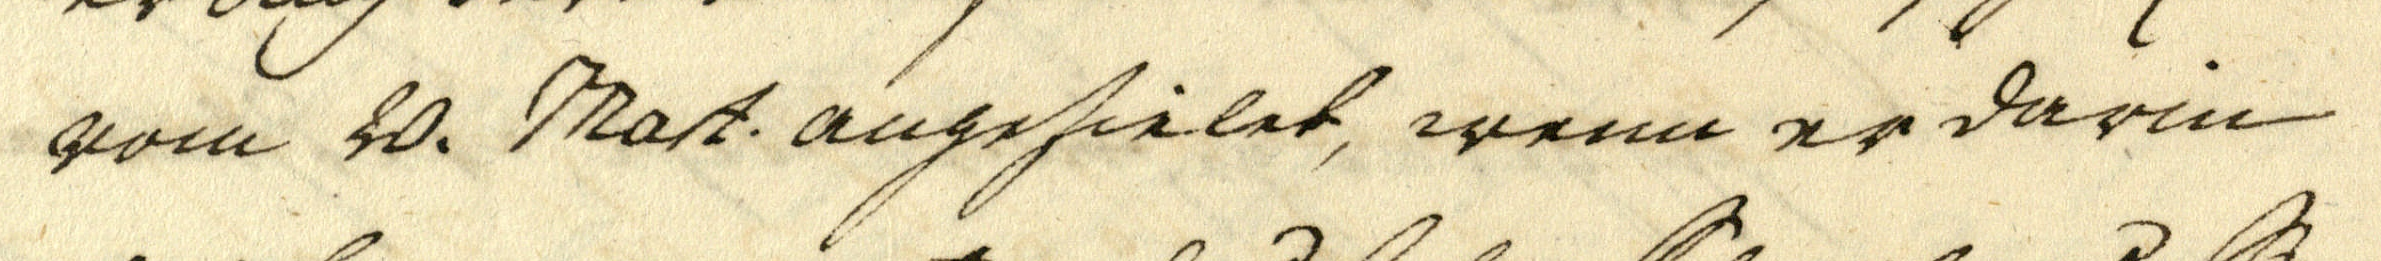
vom 20. Mart. angezielet, wenn er darin
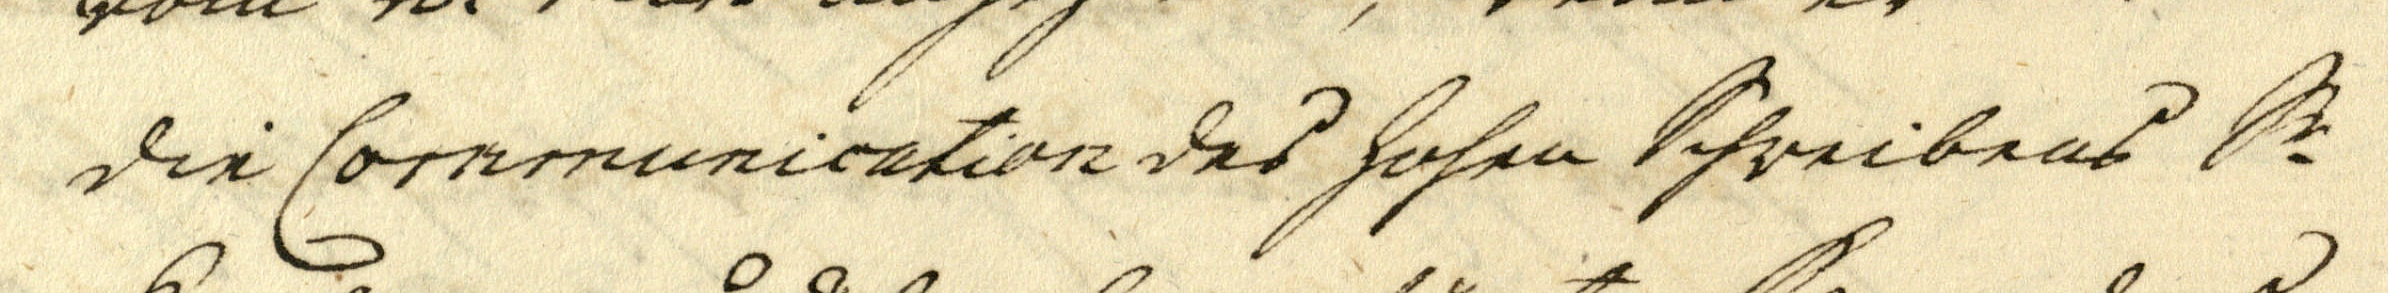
die Communication des Hohen Schreibens Sr
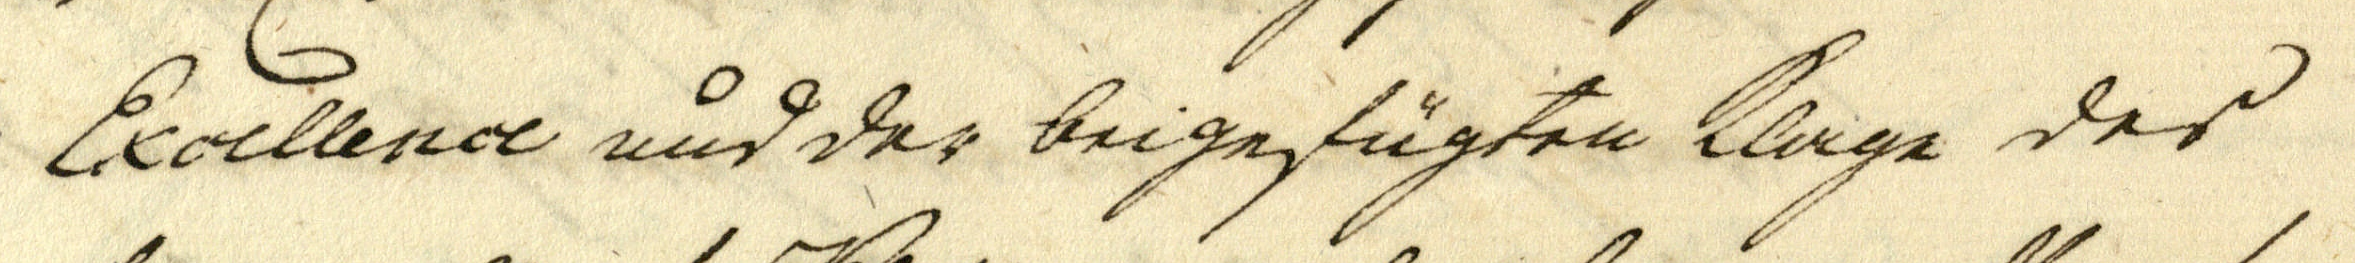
Excellence und der beigefügten Klage des
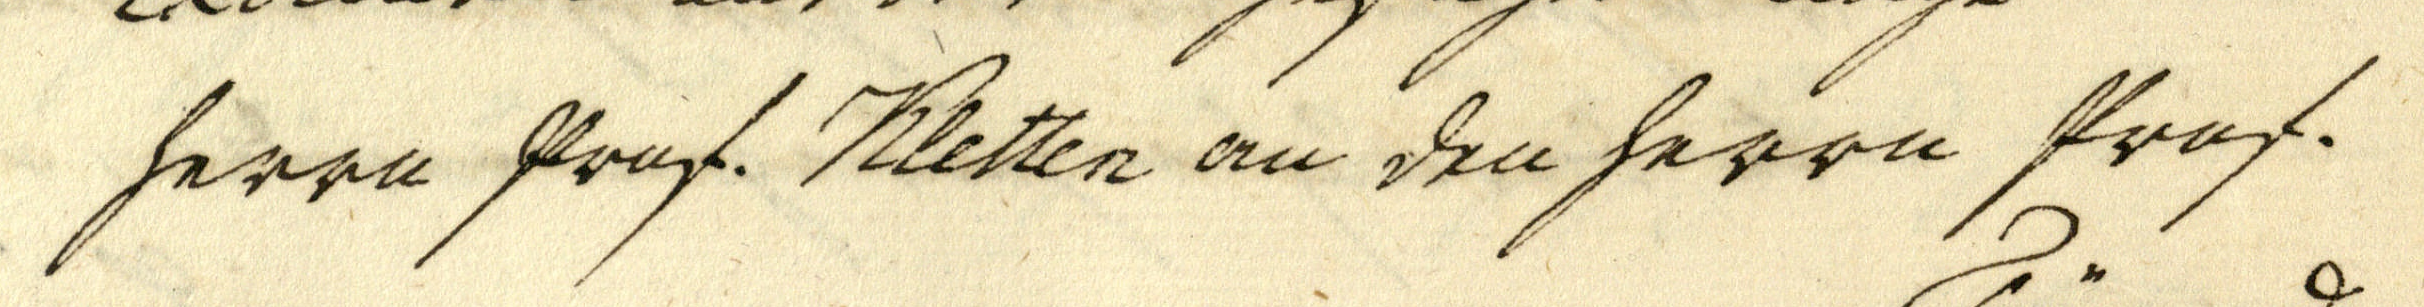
Herrn Prof. Kletten an den Herrn Prof.
